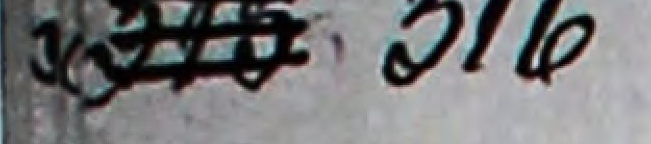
315 316
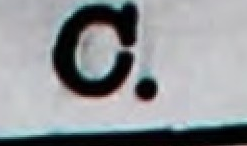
C.
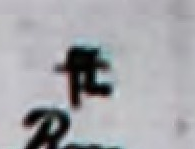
fl.
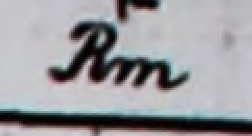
Rm
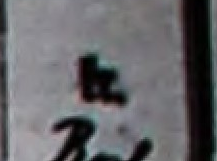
tr.
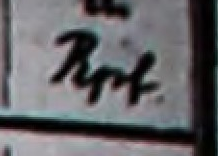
Rpf
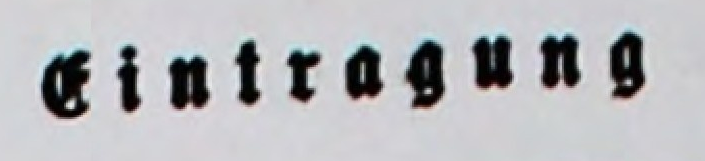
Eintragung
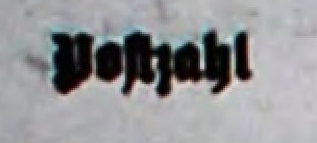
Postzahl
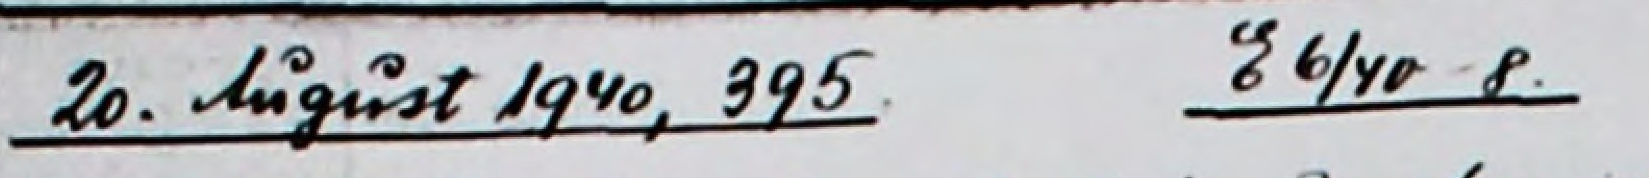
20. August 1940, 395. E 6/40 8.
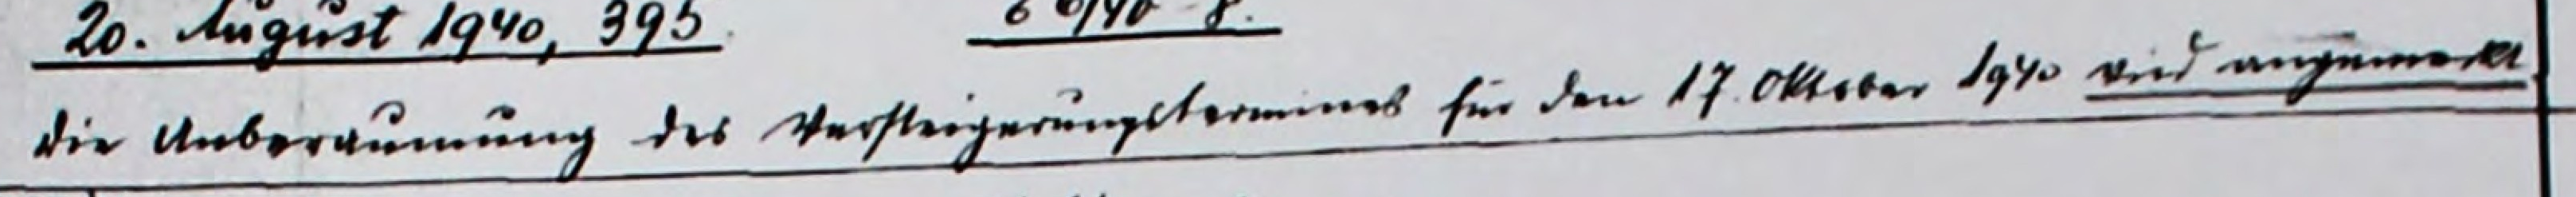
Die Anberaumung des Versteigerungstermines für den 17. Oktober 1940 wird angemerkt.
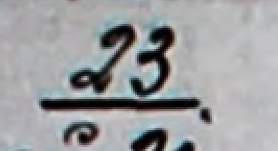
23
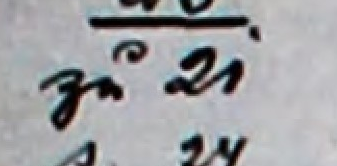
zu 21
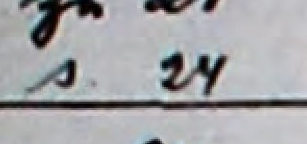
s. 24
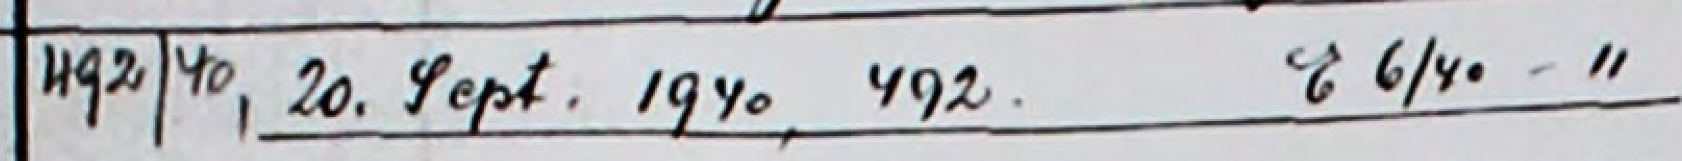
492/40, 20. Sept. 1940, 492. E 6/40 - 11
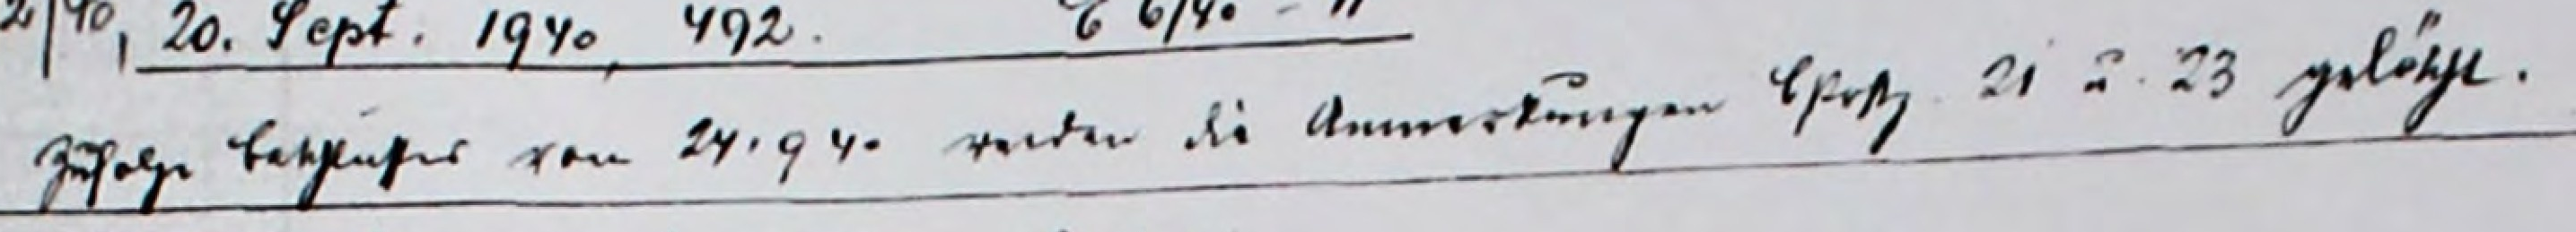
Zufolge Beschlusses von 24. 9 4- werden die Anmerkungen 6 Postz. 21 u. 23 gelöscht.
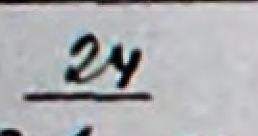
24
